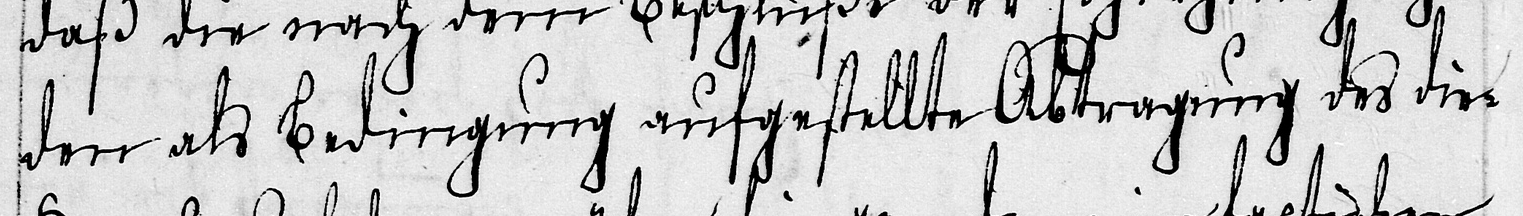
den als Bedingung aufgestellte Abtragung des die¬
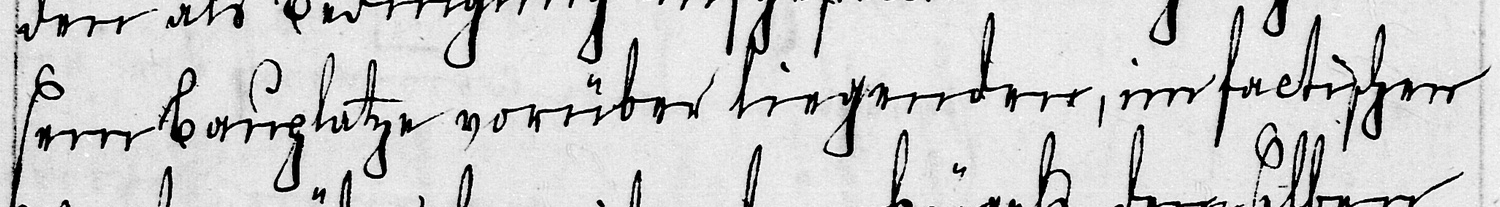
sem Bauplatze vorüber liegenden, im factischen
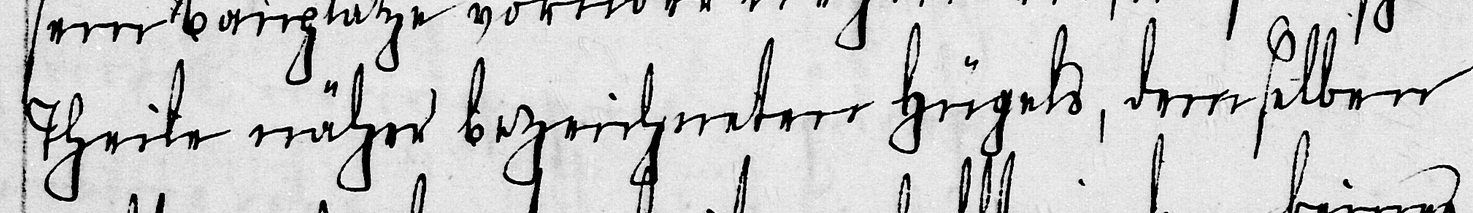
Theile näher bezeichneten Hügels, demselben
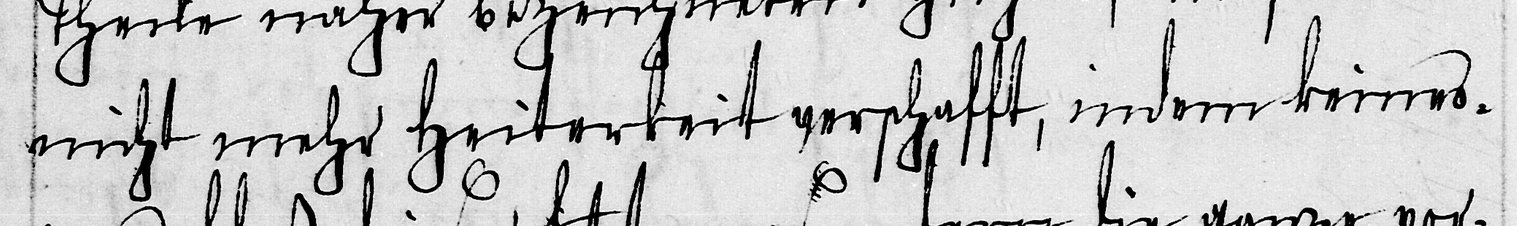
nicht mehr Heiterkeit verschafft, indem keines¬
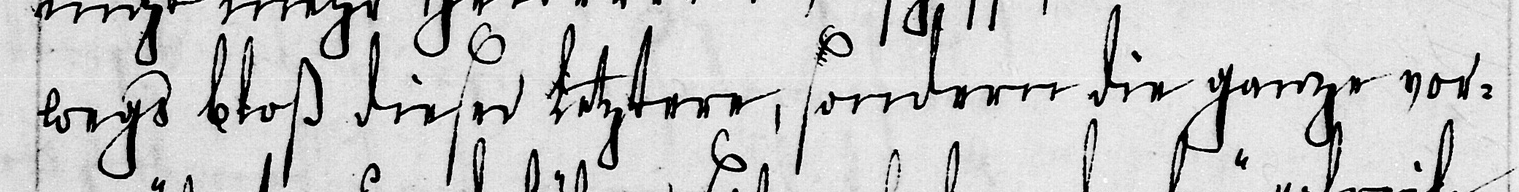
wegs bloß dieser Letztere, sondern die ganze vor¬
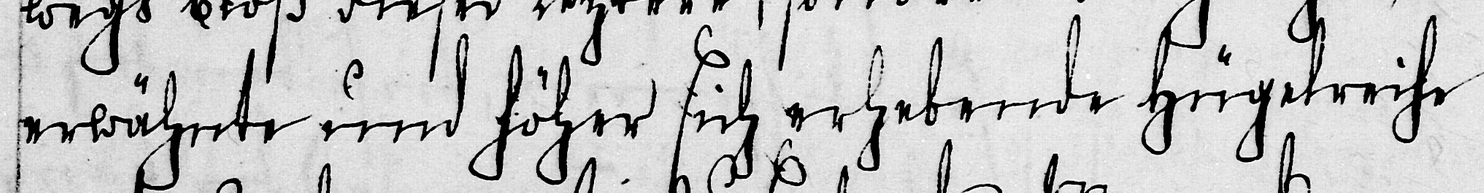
erwähnte und höher sich erhebende Hügelreihe
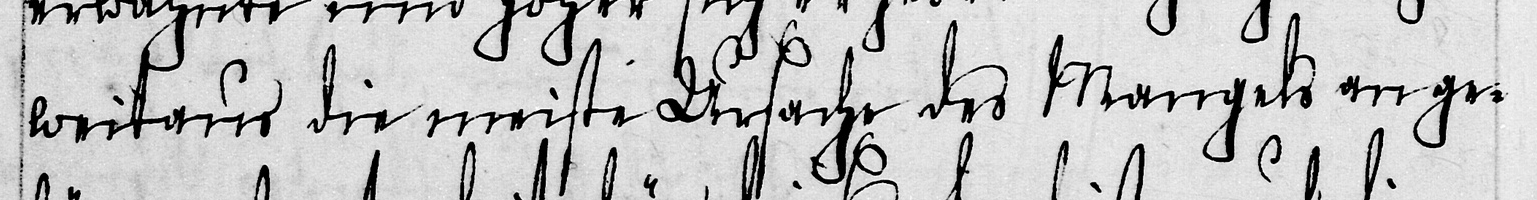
weitaus die meiste Ursache des Mangels an ge¬
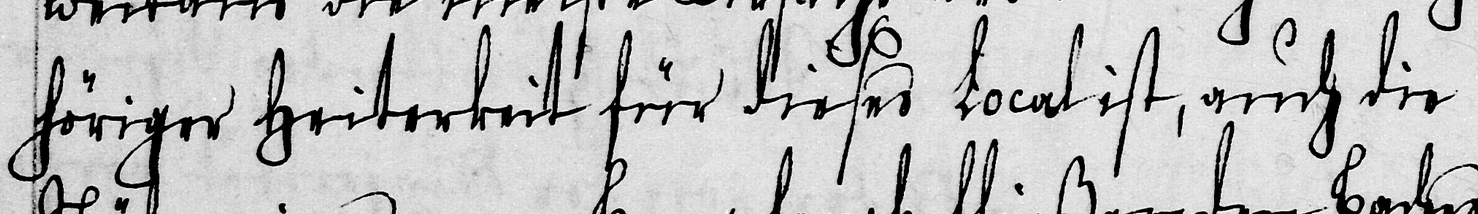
höriger Heiterkeit für dieses Local ist, auch die
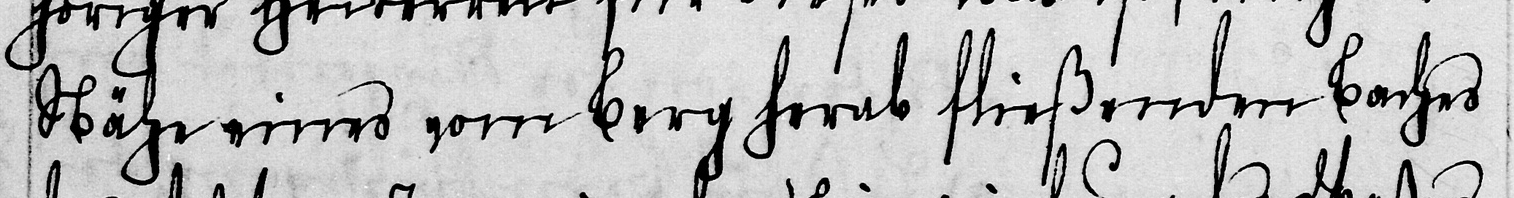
Nähe eines vom Berg herab fließenden Baches
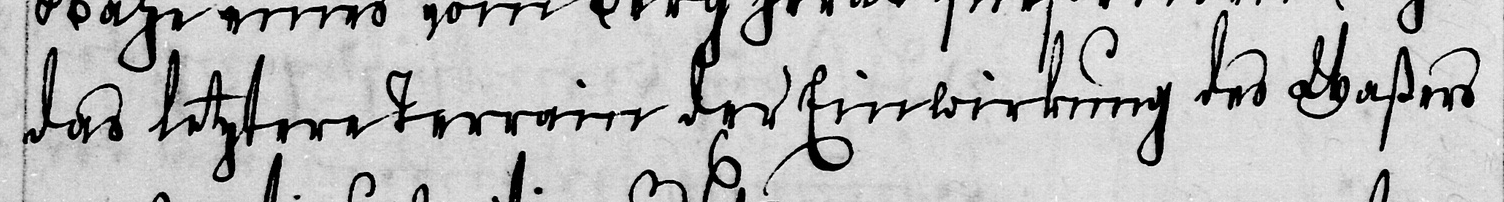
das letztere Terrain der Einwirkung des Waßers
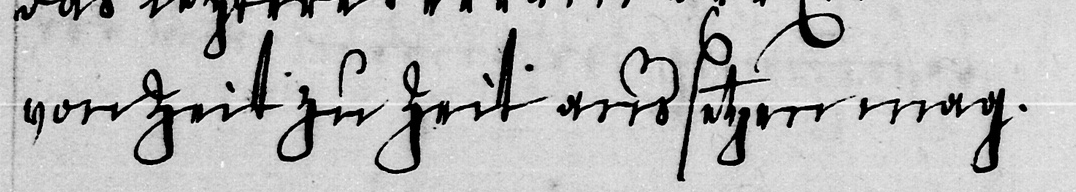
von Zeit zu Zeit aussetzen mag.
